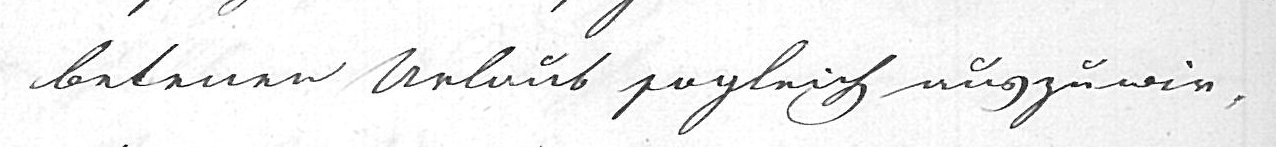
betenen Urlaub sogleich auszuwir-
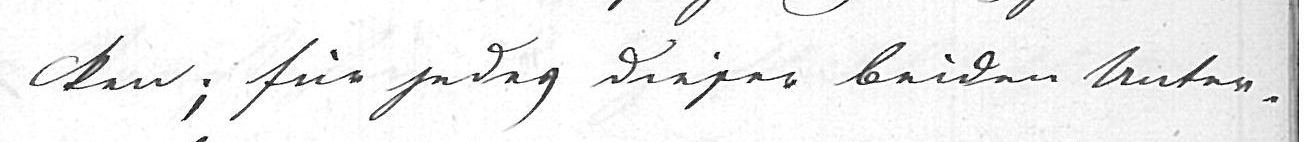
ken; für jedes dieser beiden Unter-
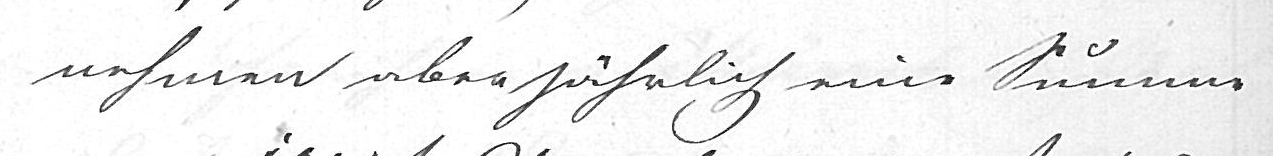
nehmen aber jährlich eine Summe
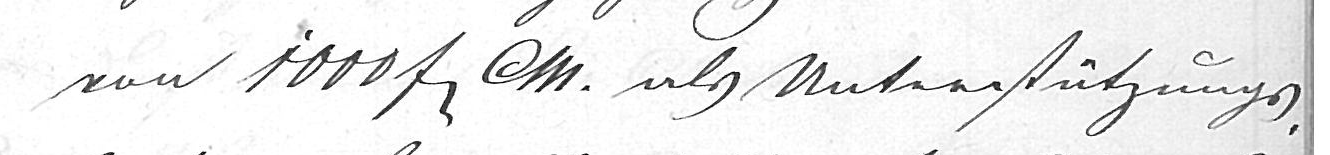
von 1000 fl. CM als Unterstützungs-
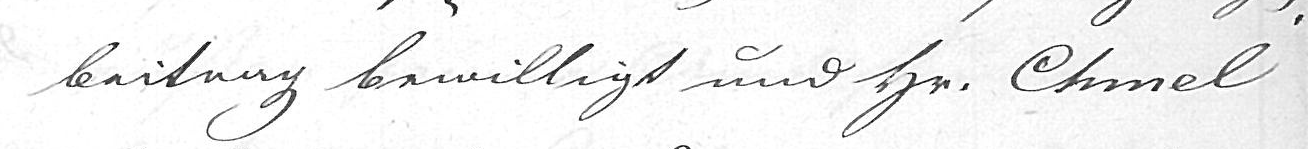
beitrag bewilligt und Hr. Chmel
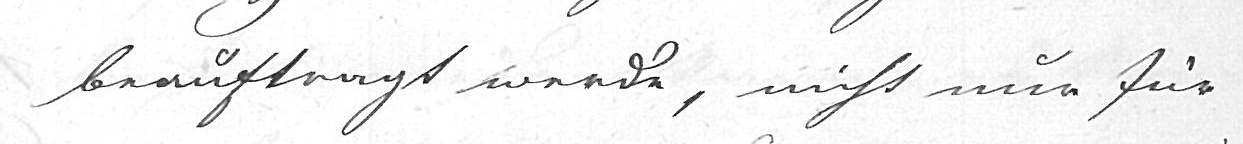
beauftragt werde, nicht nur für
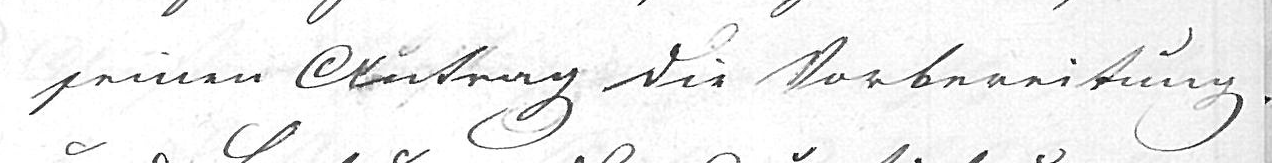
seinen Antrag die Vorbereitung
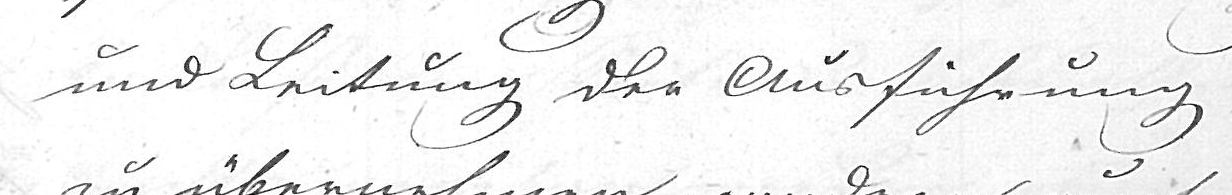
und Leitung der Ausführung
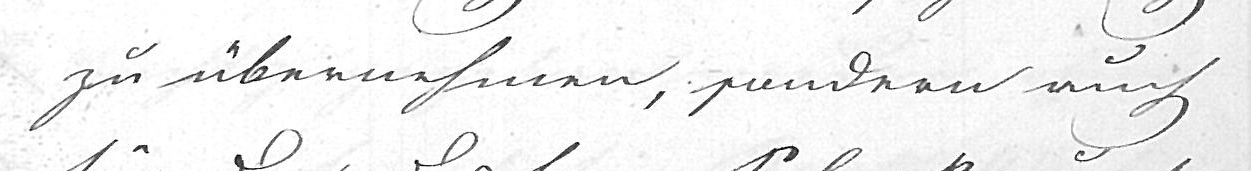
zu übernehmen, sondern auch
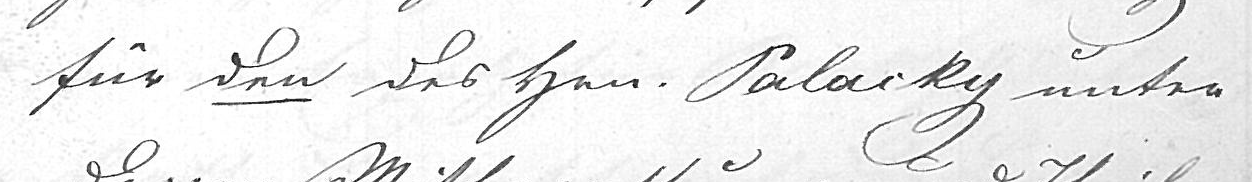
für den des Hrn. Palacky unter
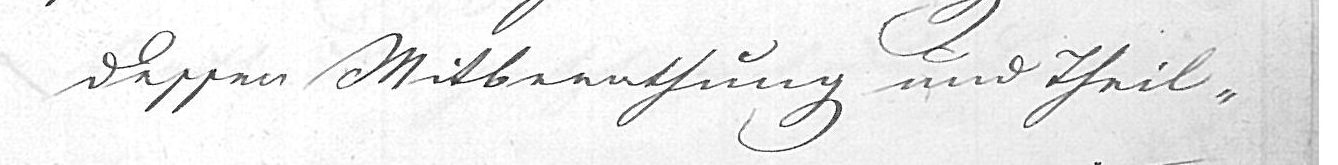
dessen Mitberathung und Theil-
